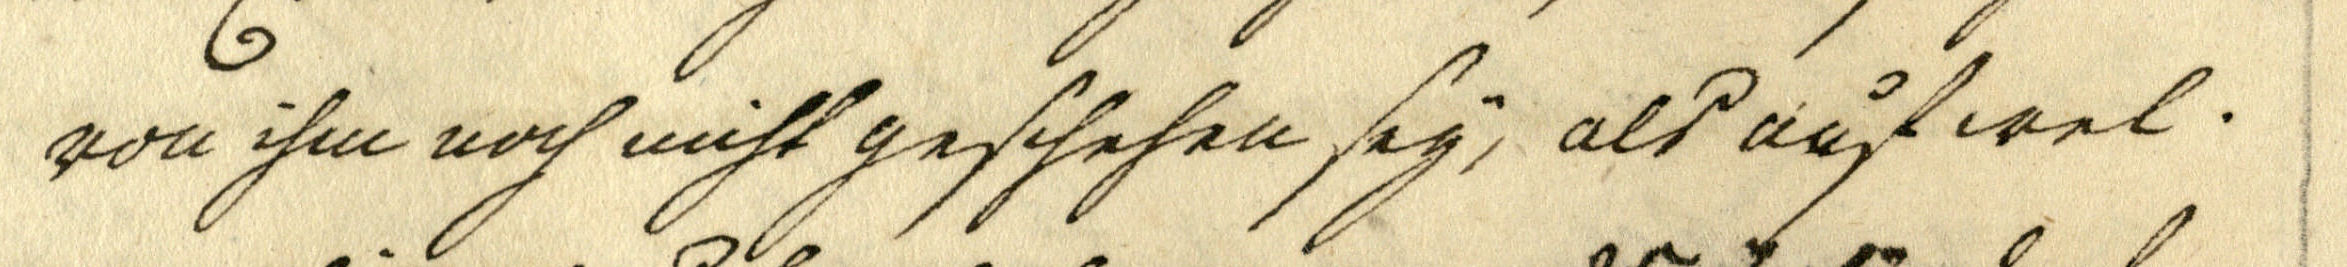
von ihm noch nicht geschehen seÿ, als auf wel-
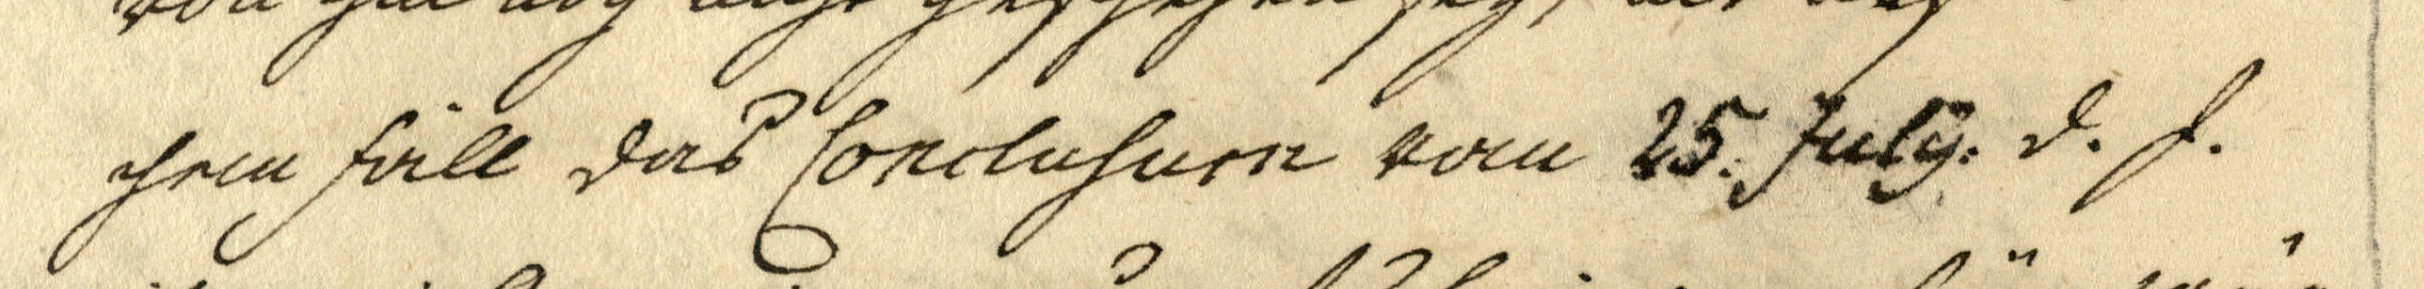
chem Fall, das Conclusum vom 25. Julÿ. d. J.
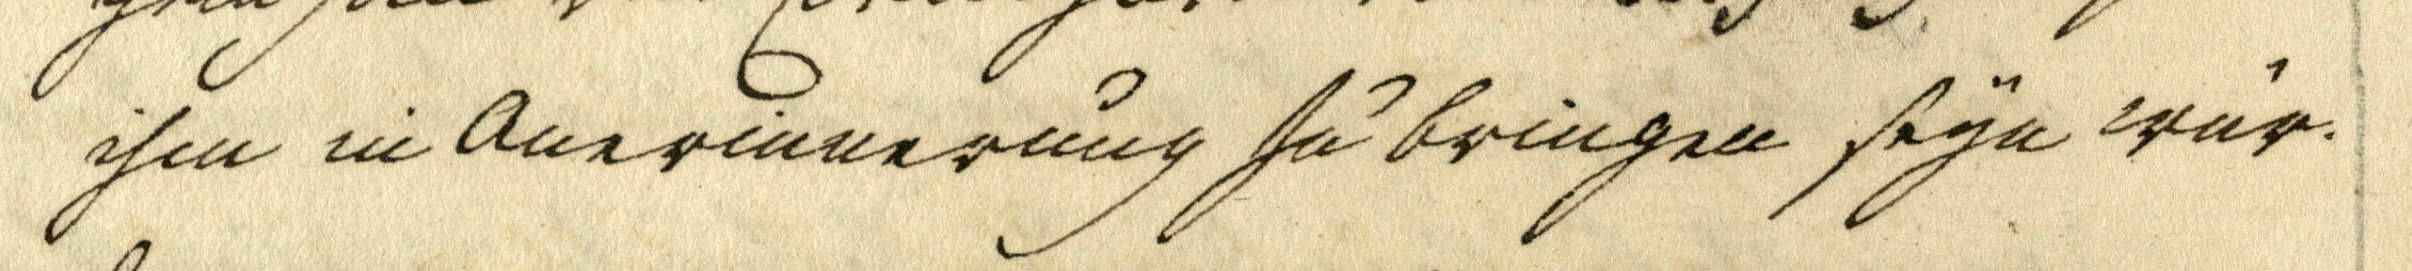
ihm in Anerinnerung zu bringen seÿn wür¬
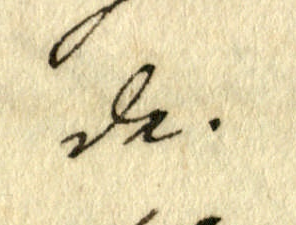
de.
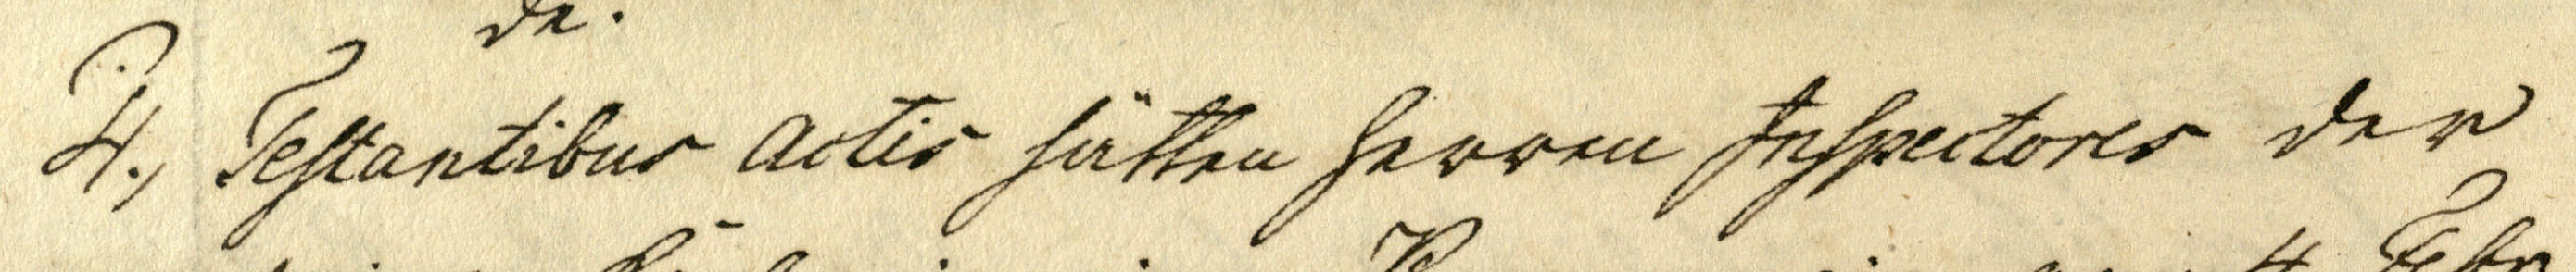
4. Testantibus Actis hätten Herren Inspectores der
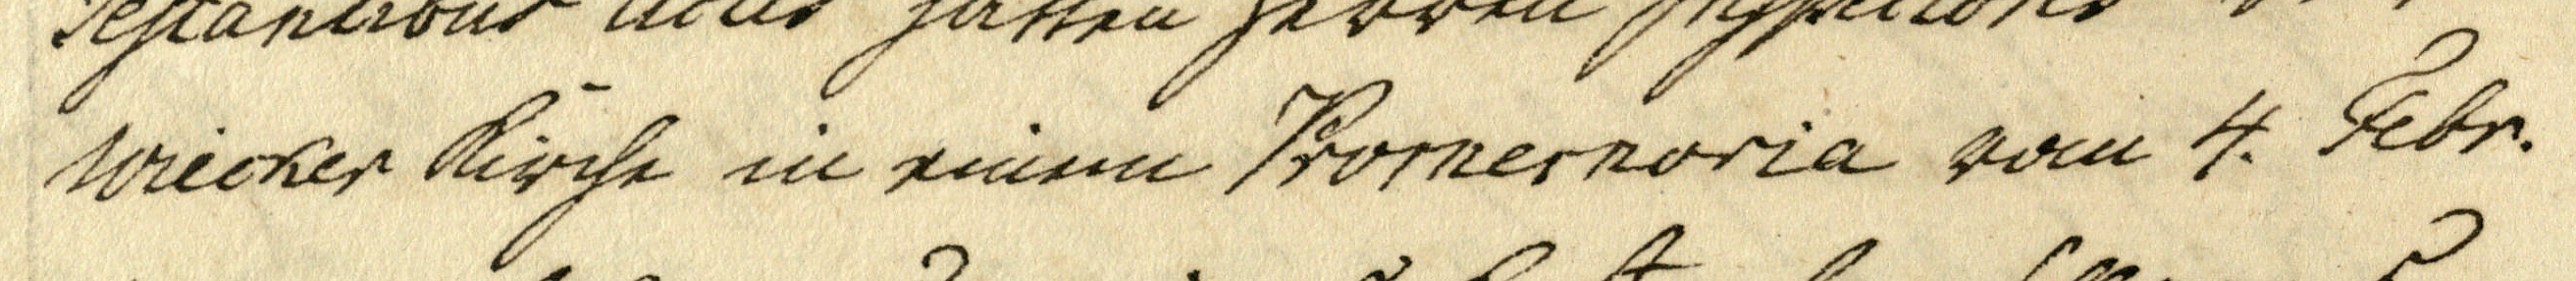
Wiecker Kirche in einem Promemoria vom 4. Febr.
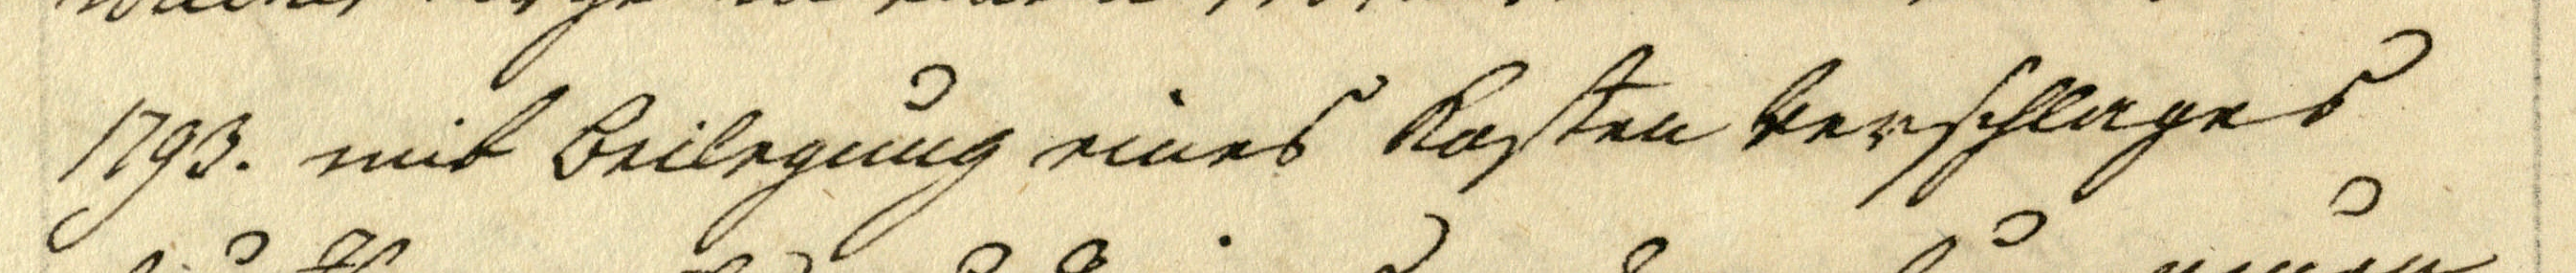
1793. mit Beilegung eines Kosten Verschlages
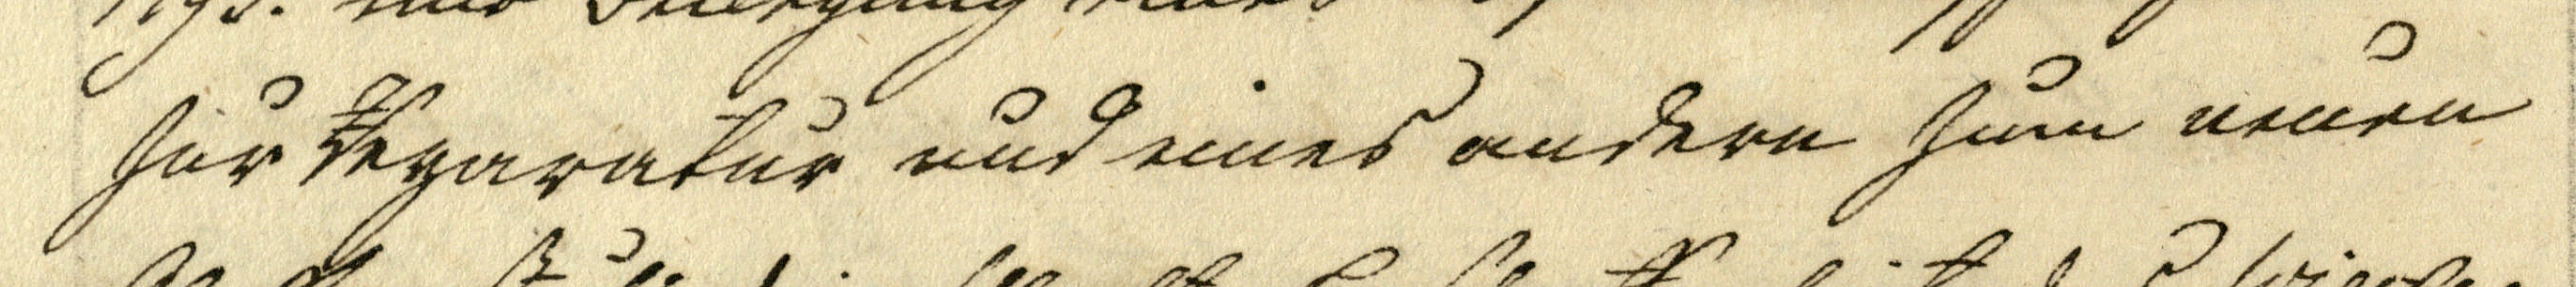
zur Reparatur und eines andern zum neuen
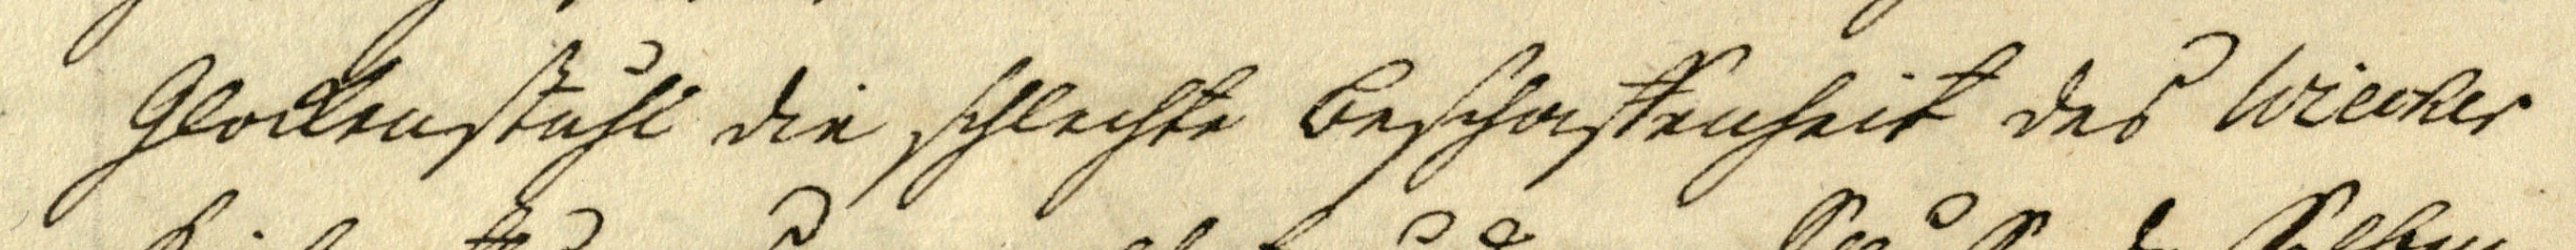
Glockenstuhl die schlechte Beschaffenheit des Wiecker
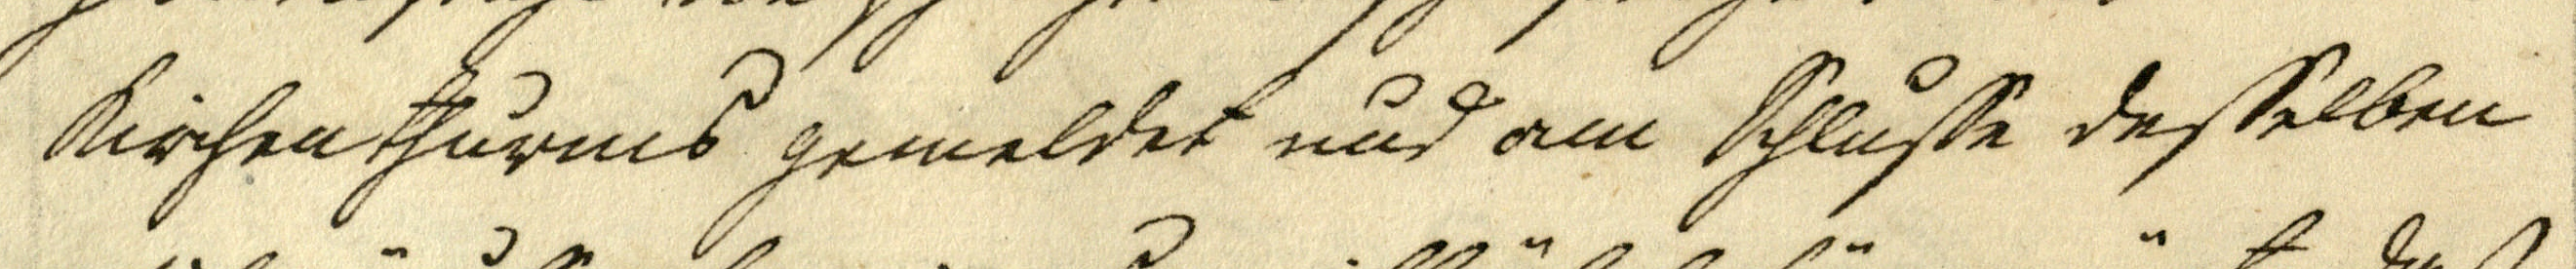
Kirchenthurms gemeldet und am Schlusse desselben
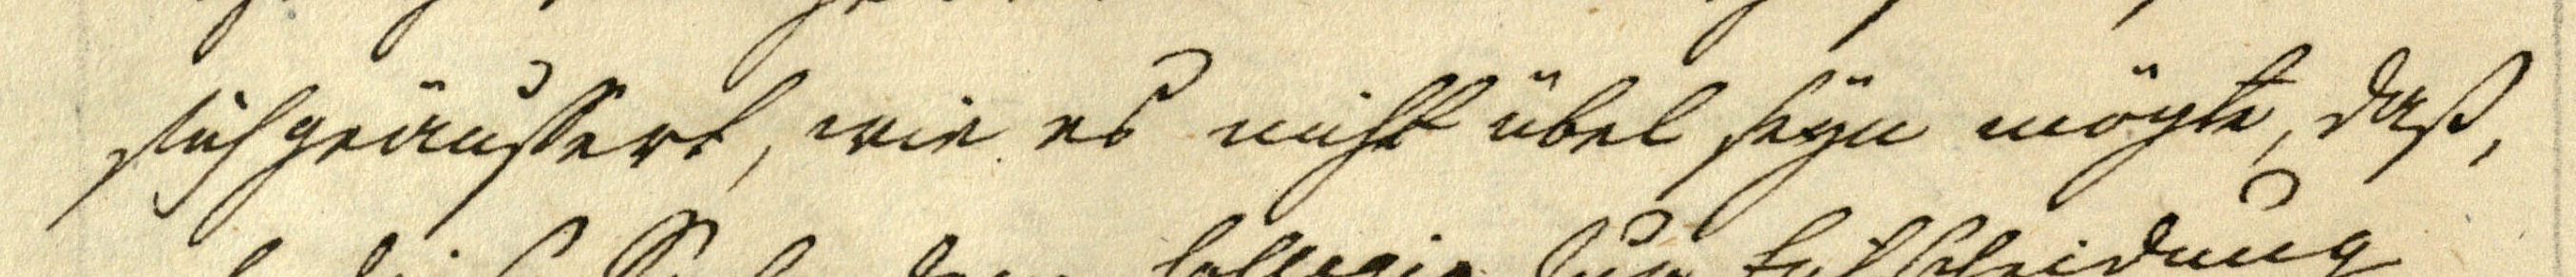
sich geäussert, wie es nicht übel seÿn mögte, daß,
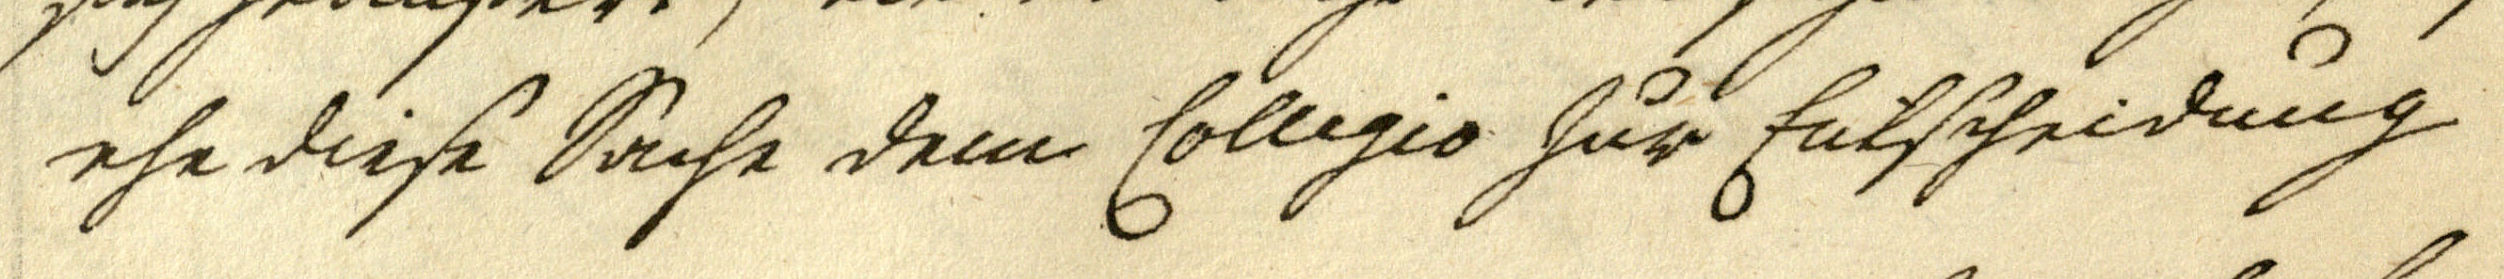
ehe diese Sache dem Collegio zur Entscheidung
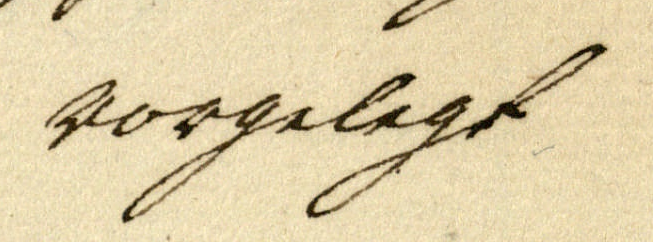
vorgelegt
